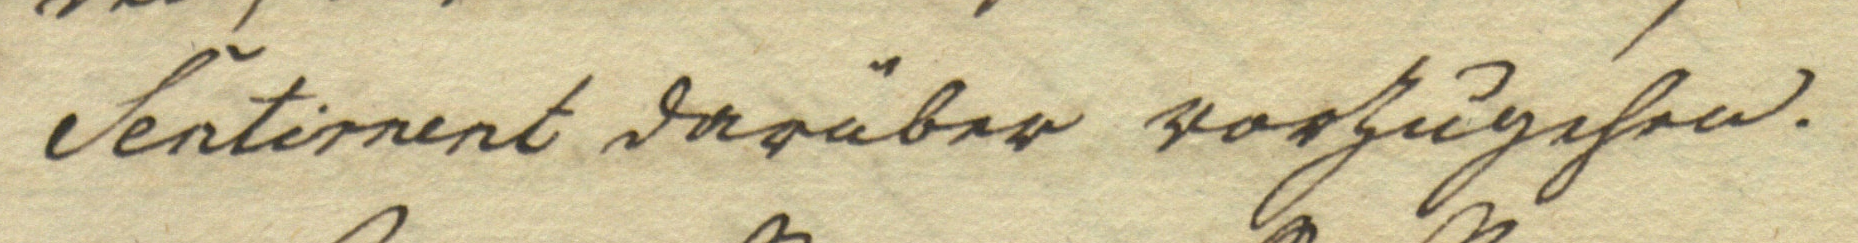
Sentiment darüber vorzugehen.
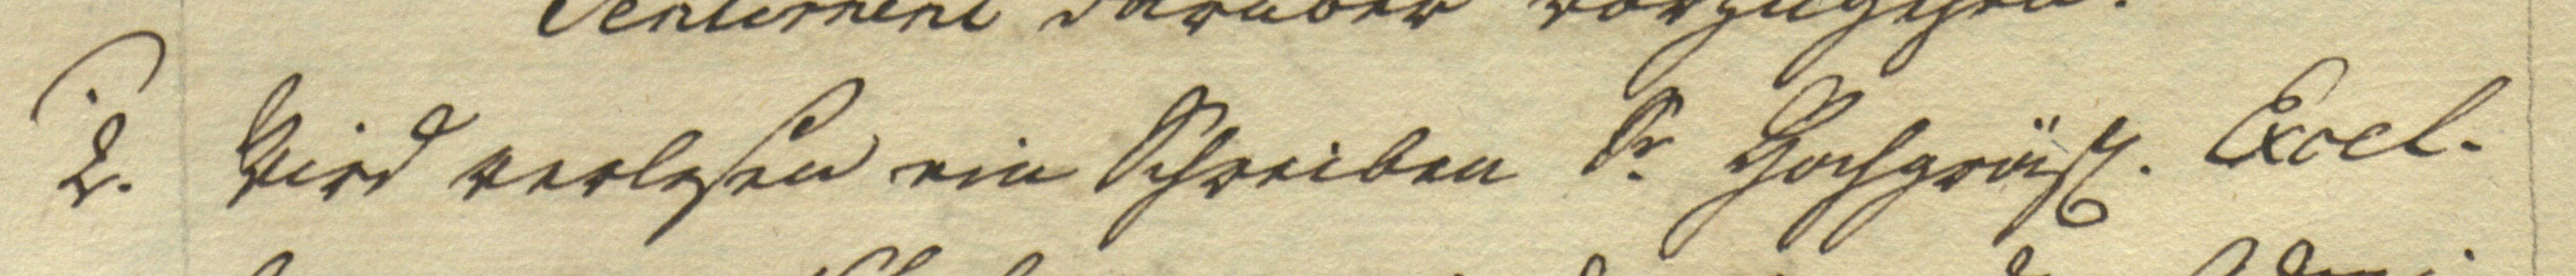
2. Wird verlesen ein Schreiben Sr. Hochgräfl. Excel¬
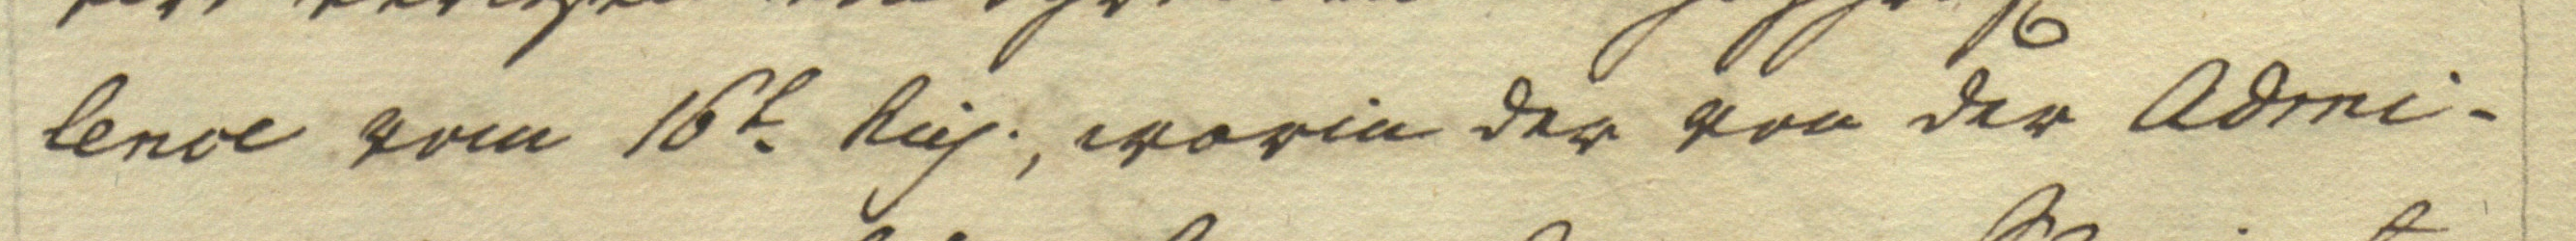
lence vom 16 t. huj., worin der von der Admi¬
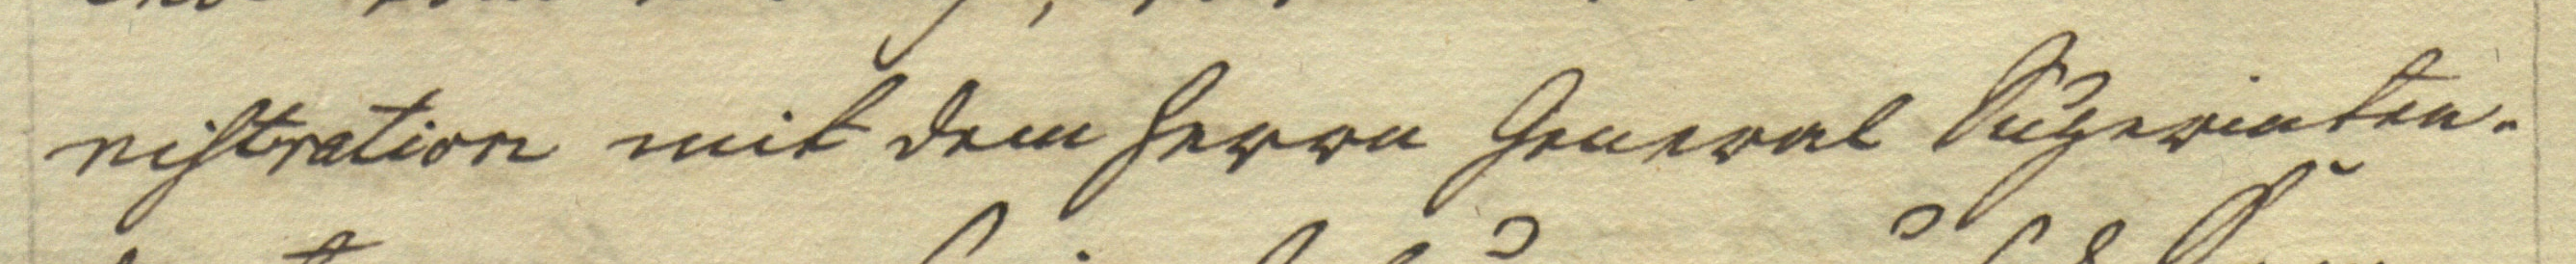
nistration mit dem Herrn General Superinten¬
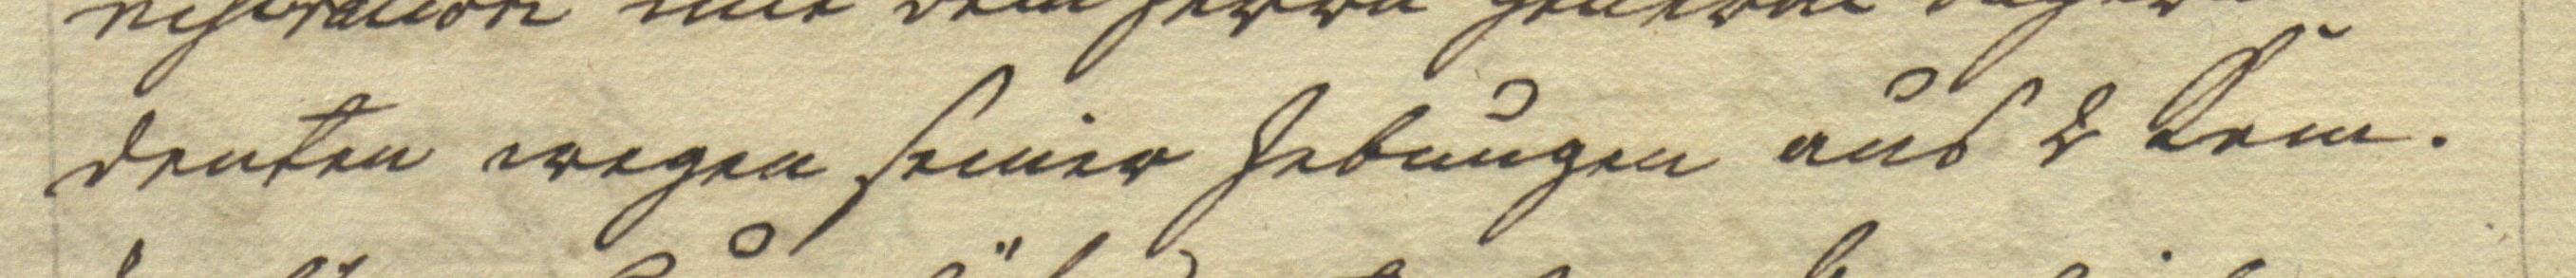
denten wegen seiner Hebungen aus 2 Kem¬
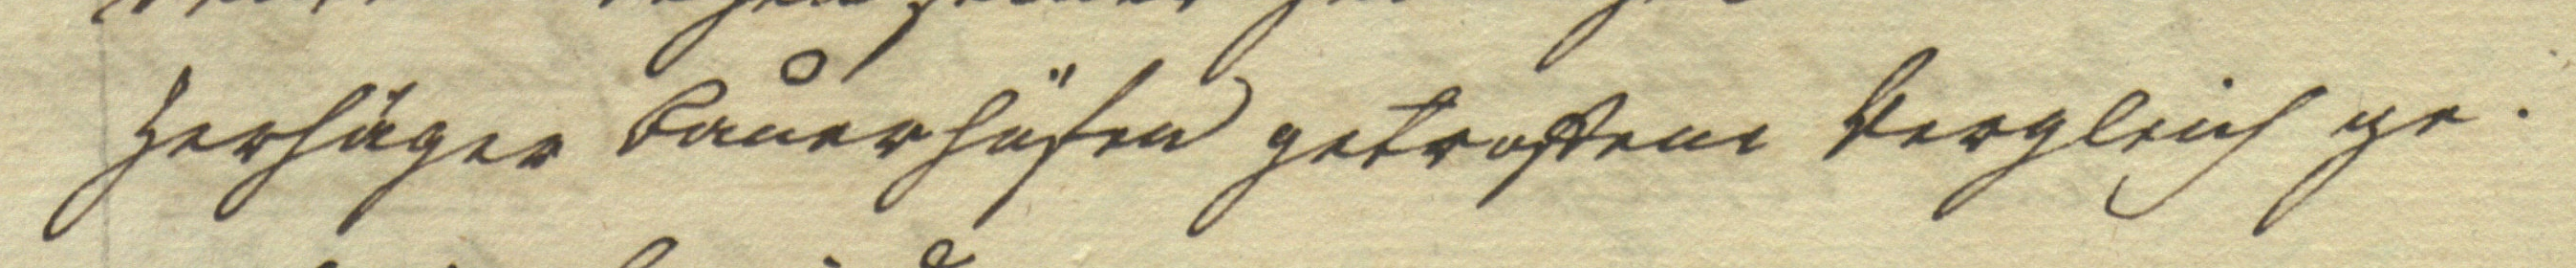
zerhäger Bauerhöfen getroffene Vergleich ge¬
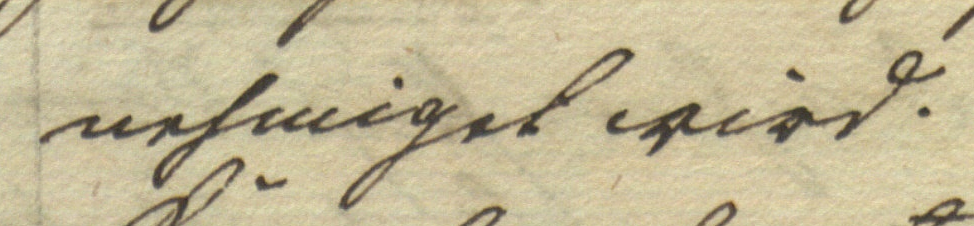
nehmiget wird.
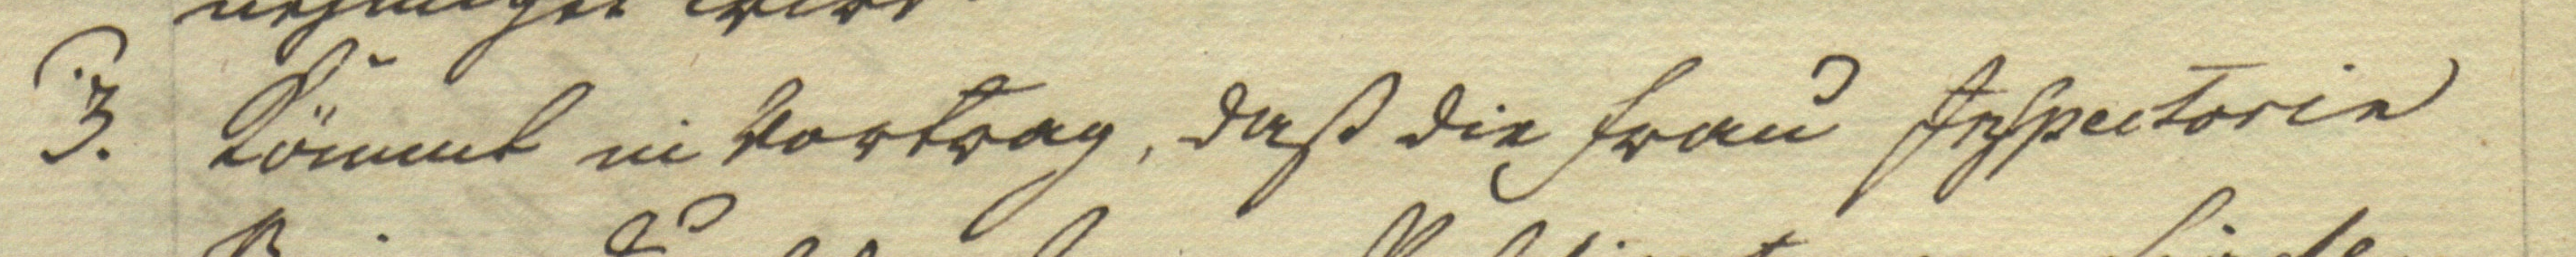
3. Kömmt in Vortrag, daß die Frau Inspectorin
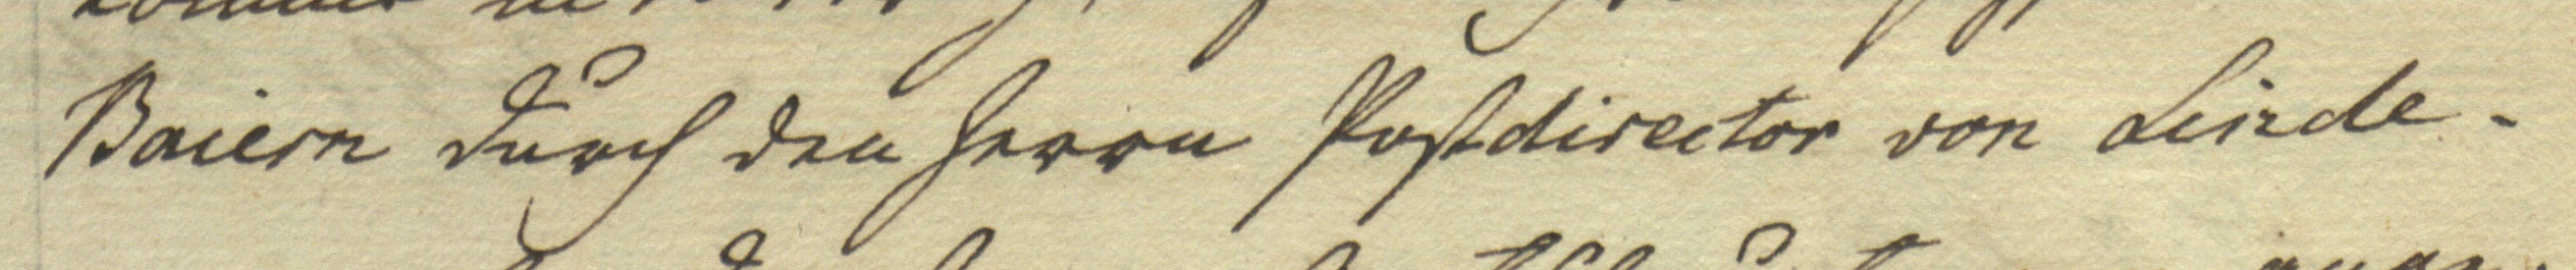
Baiern durch den Herrn Postdirector von Linde¬
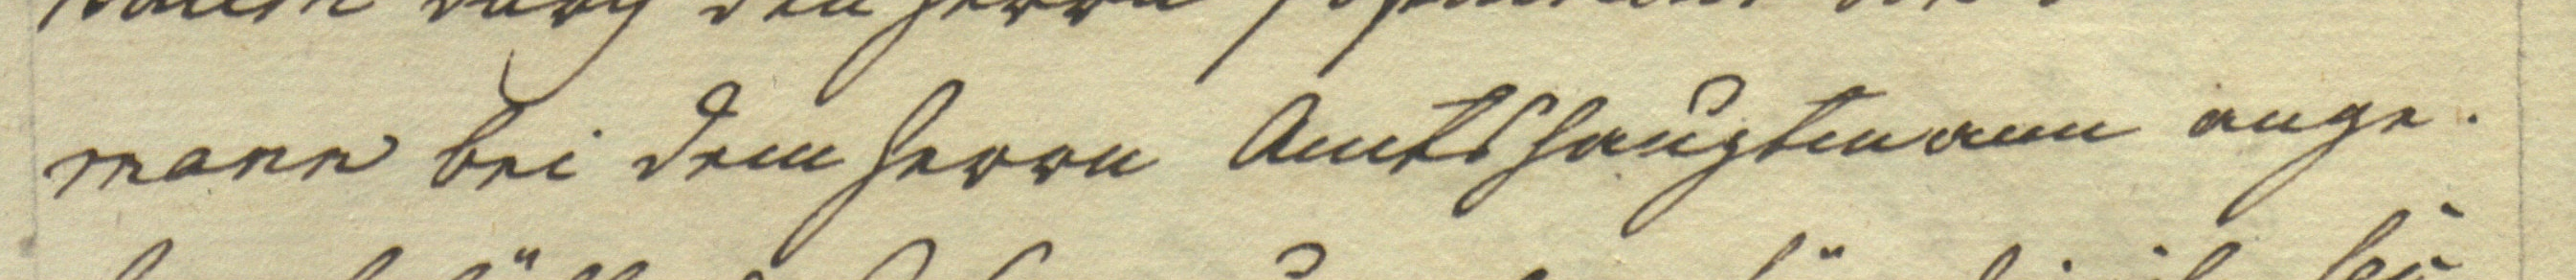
mann bei dem Herrn Amtshauptmann ange¬
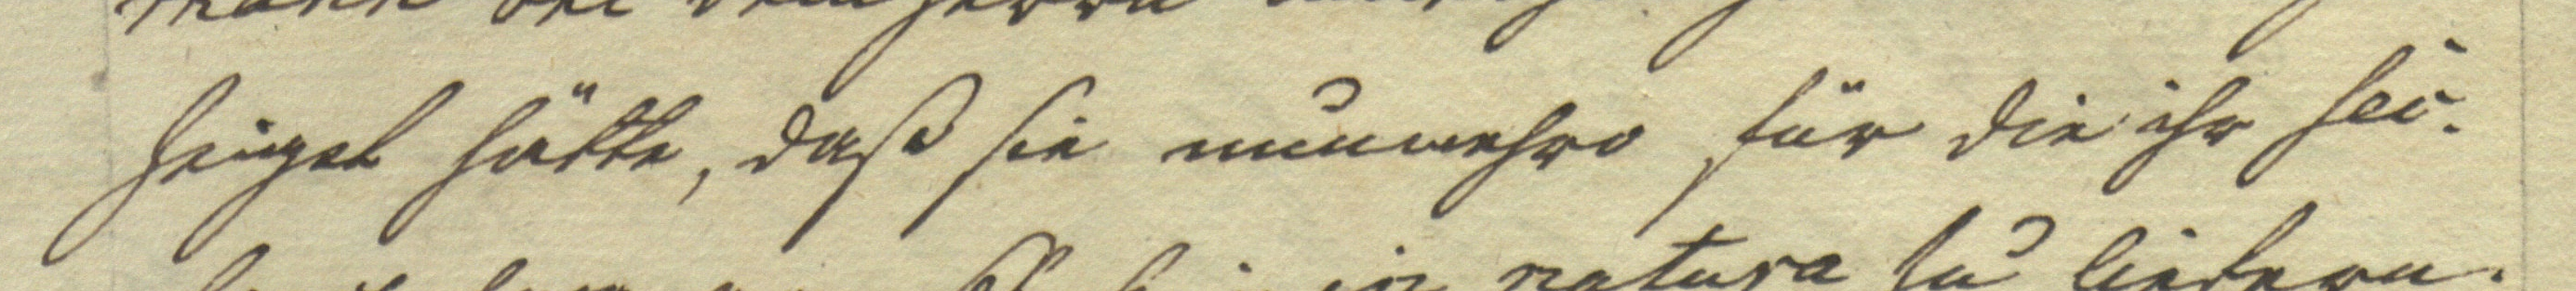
zeiget hätte, daß sie nunmehro für die ihr sec.¬
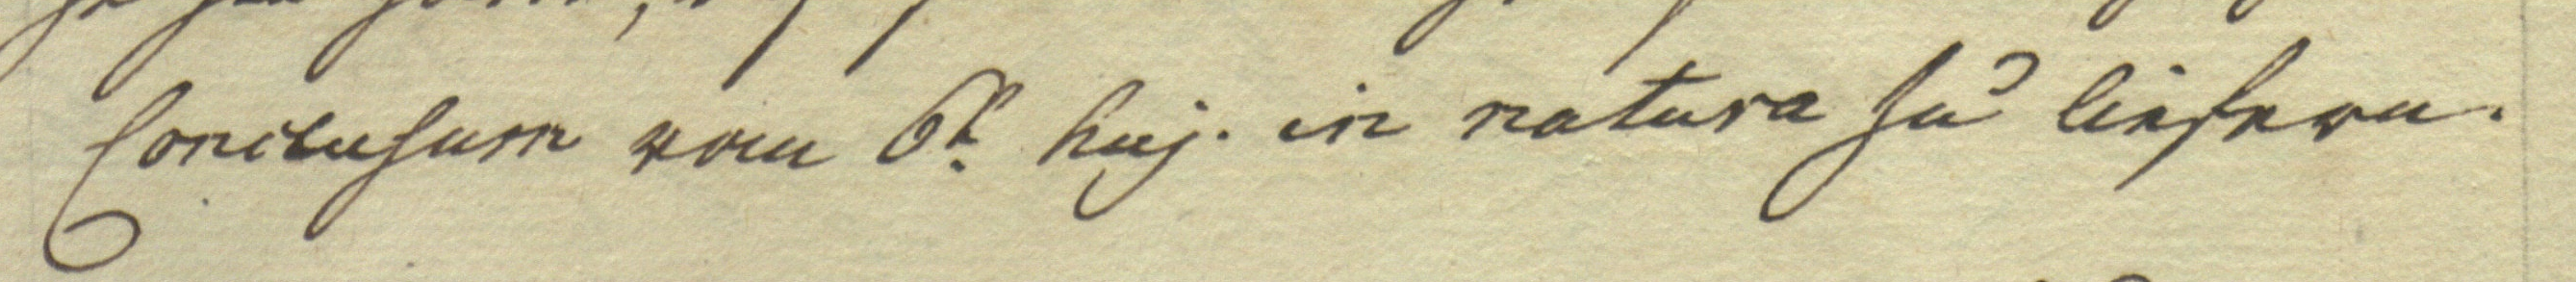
Conclusum vom 6 t. huj. in natura zu liefern¬
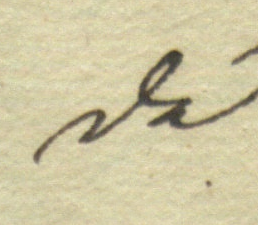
de
